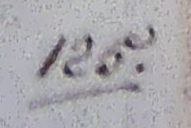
125.
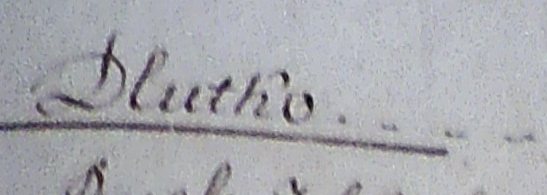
Dlutko . .. .. ..
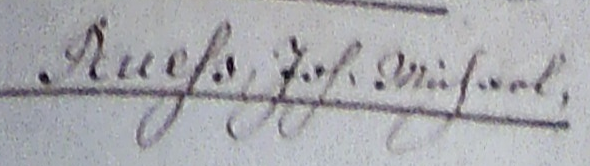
Ruess, Joh. Michael.
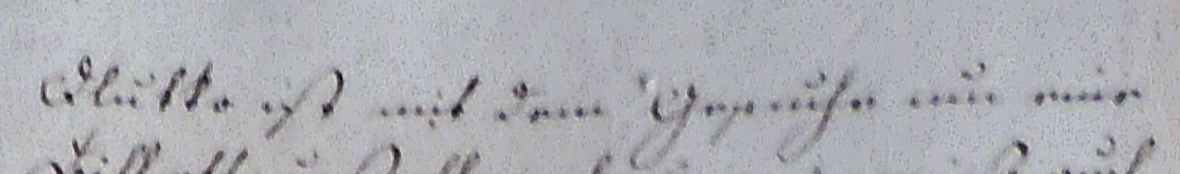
Dlutko ist mit dem Gesuche um eine
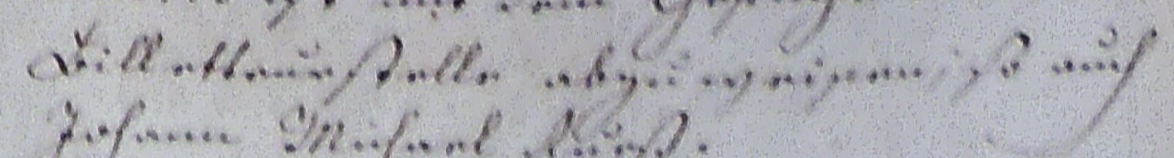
Billetteurstelle abzuweisen so auch
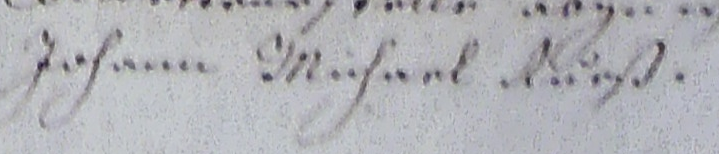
Johan Michael Rueß.
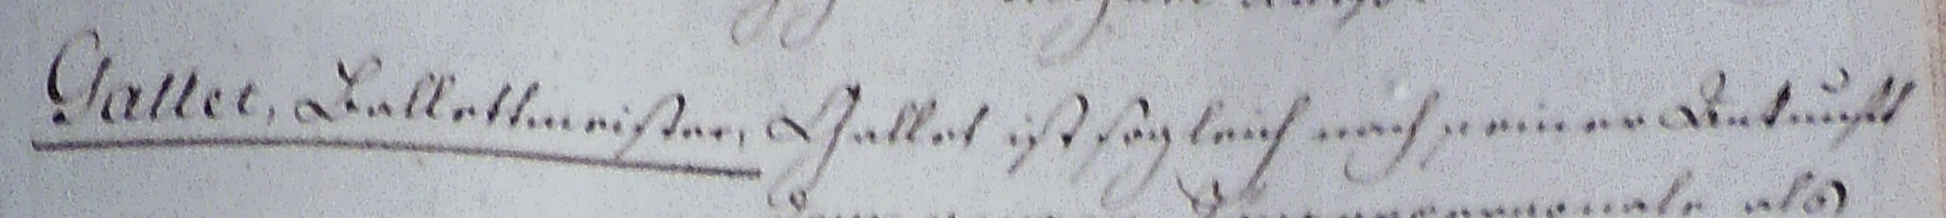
Gatter, Ballettmeister. Gallet ist sogleich nach seiner Ankunft
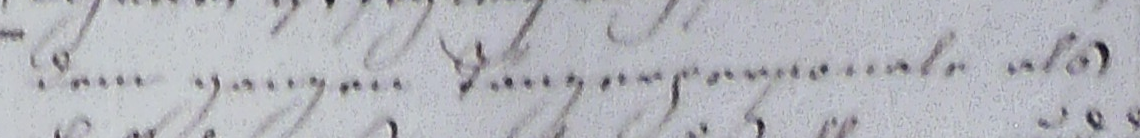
dem ganzen Tänzerpersonale als
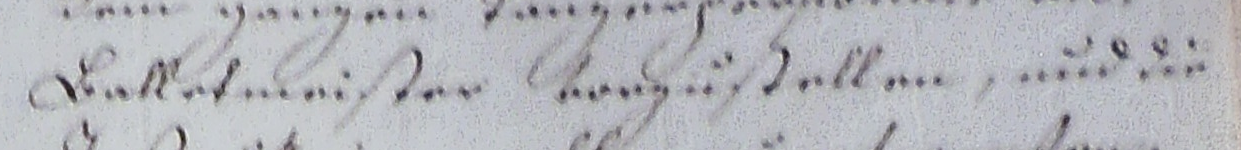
Balletmeister vorzustellen, und die
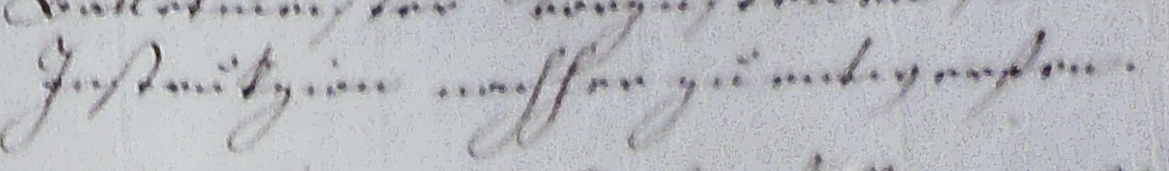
Instrukzion nachher zu entwerfen.
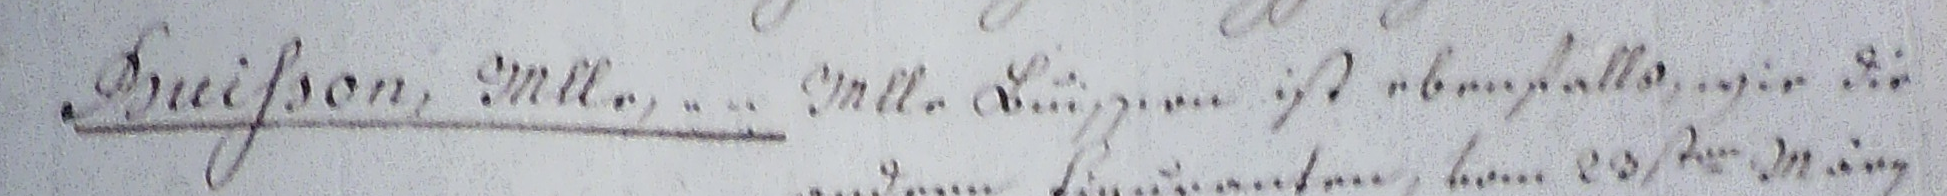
Buisson, Mlle, .. .. Mlle Buisson ist ebenfalls, wie die
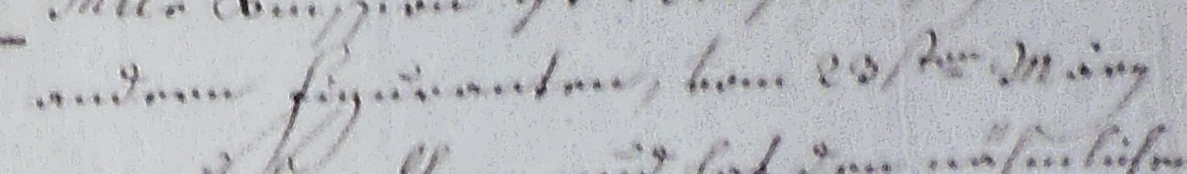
andern Figuranten, vom 23ste͇n März
